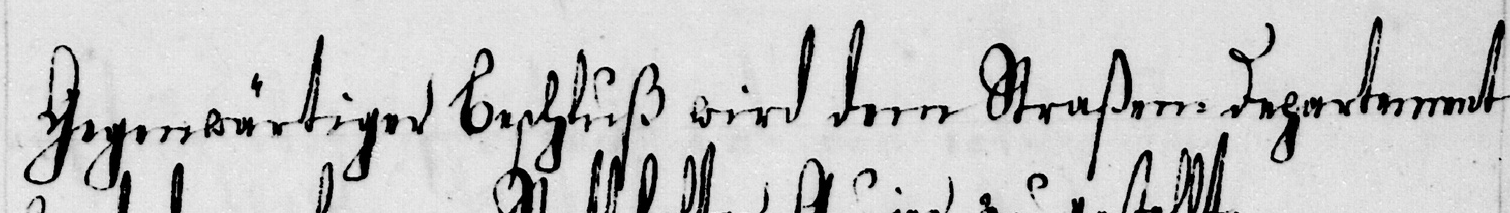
Gegenwärtiger Beschluß wird dem Straßen-Departement
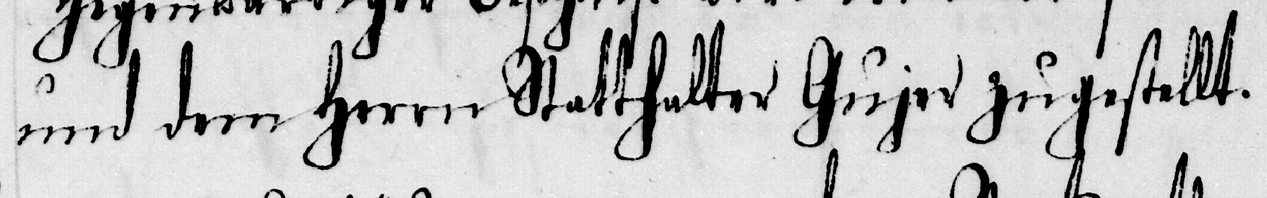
und dem Herrn Statthalter Gujer zugestellt.
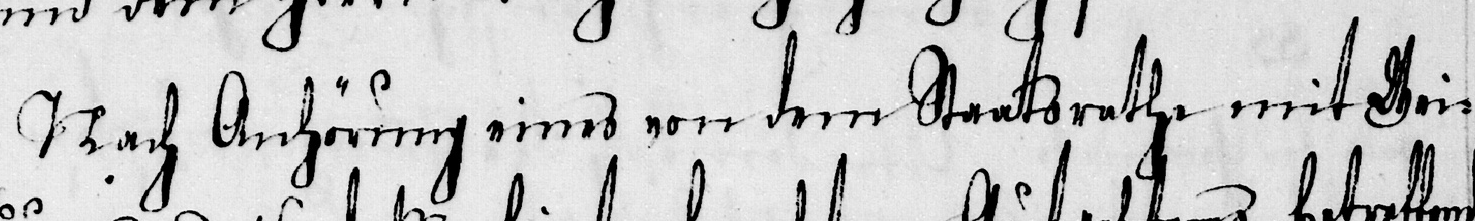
Nach Anhörung eines von dem Staatsrathe mit Wei¬
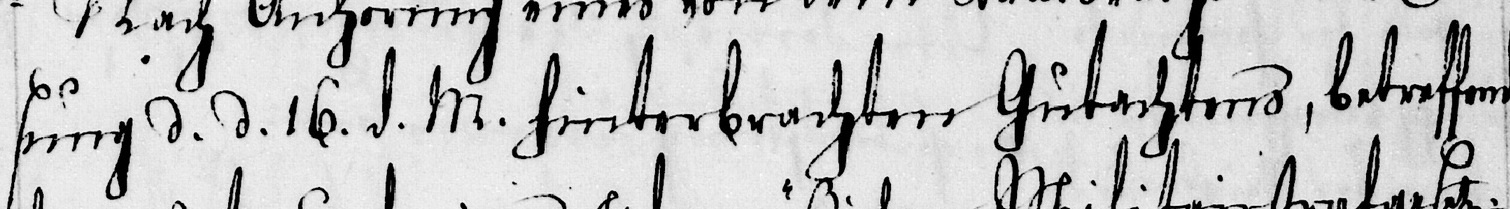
sung d. d. 16. d. M. hinterbrachten Gutachtens, betreff¬
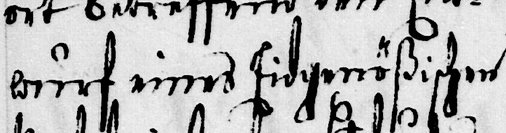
wurf eines Eidgenößischen
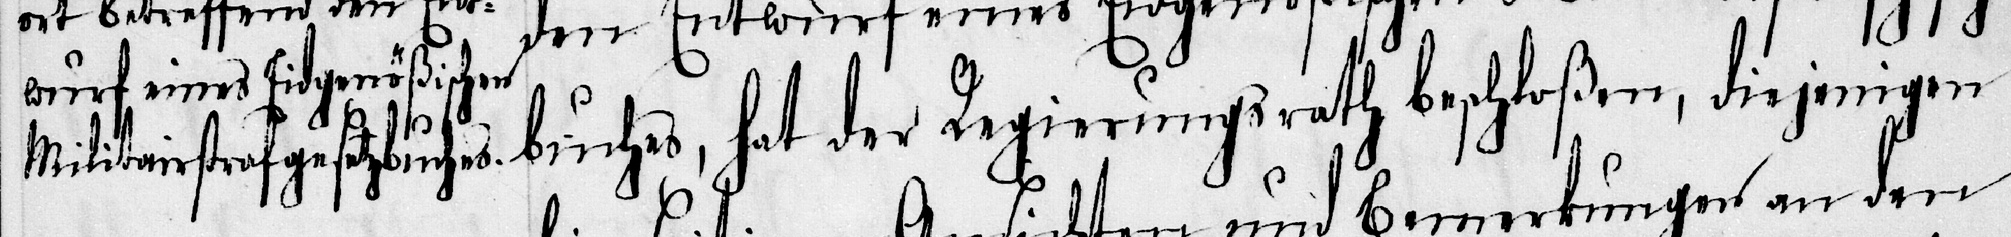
Militärstrafgesetzbuches, hat der Regierungsrath beschloßen, diejenigen
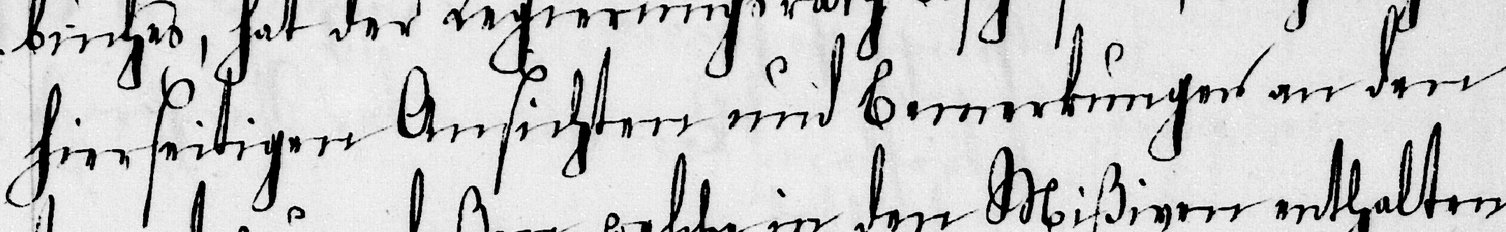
hierseitigen Ansichten und Bemerkungen an den
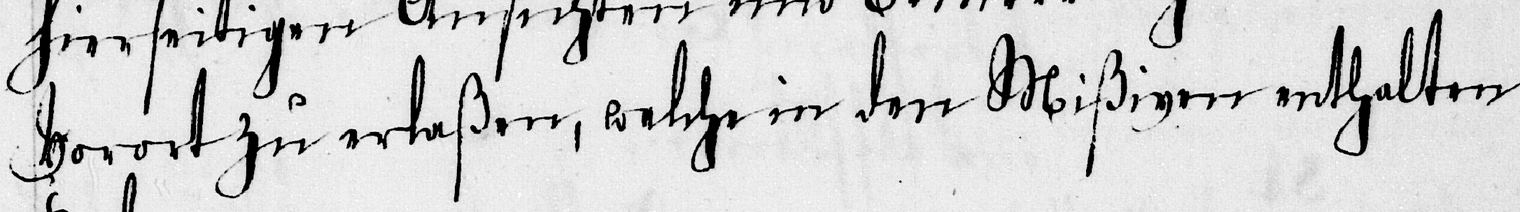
Vorort zu erlaßen, welche in den Mißiven enthalten
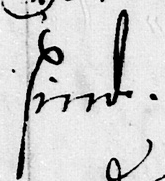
sind.
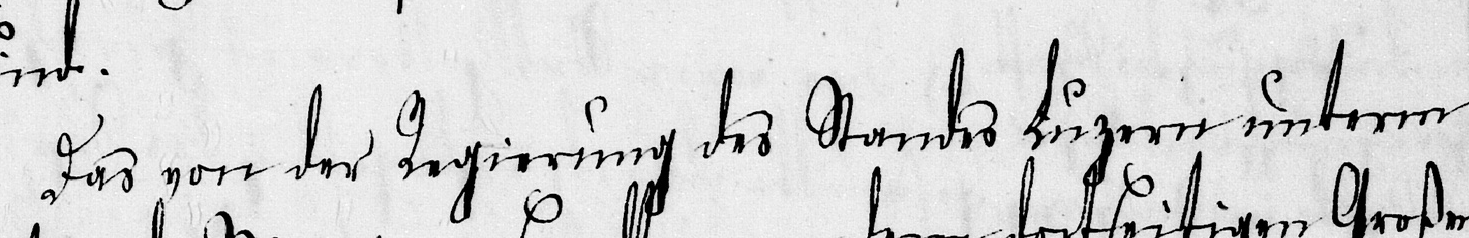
Das von der Regierung des Standes Luzern unterm
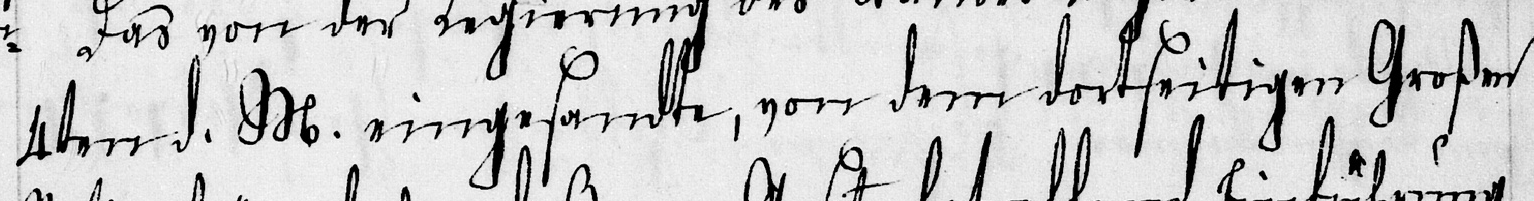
4ten d. M. eingesandte, von dem dortseitigen Großen
